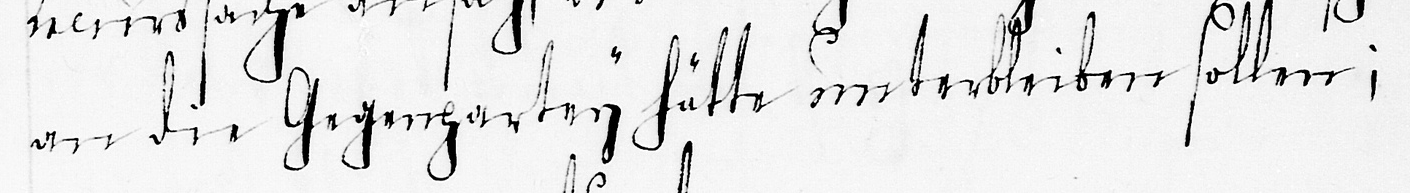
an die Gegenpartey hätte unterbleiben sollen;
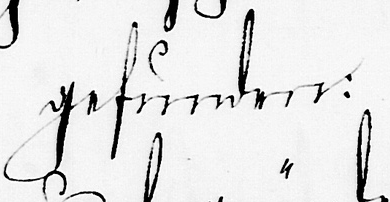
gefunden:
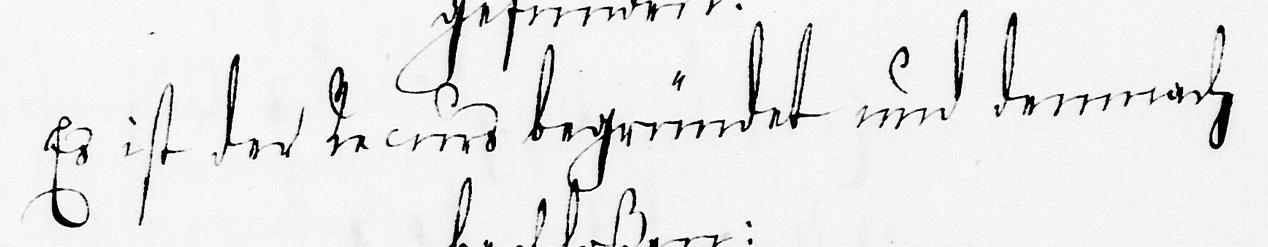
Es ist der Recurs begründet und demnach
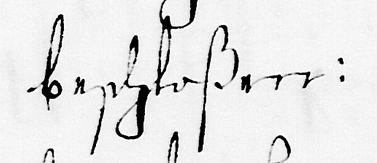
beschloßen:
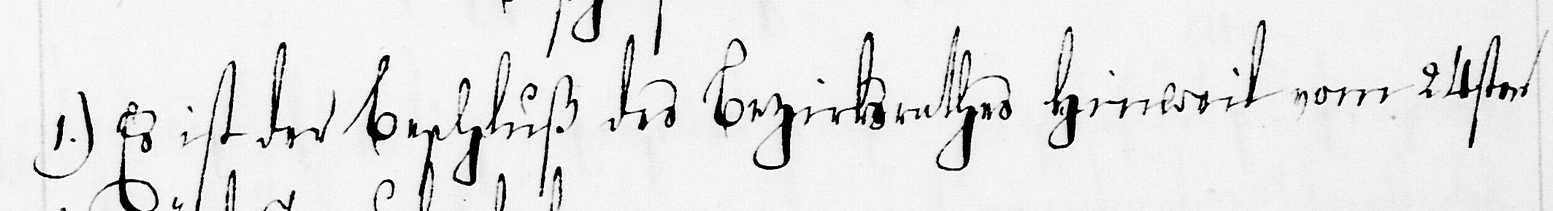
1.) Es ist der Beschluß des Bezirksrathes Hinweil vom 24sten
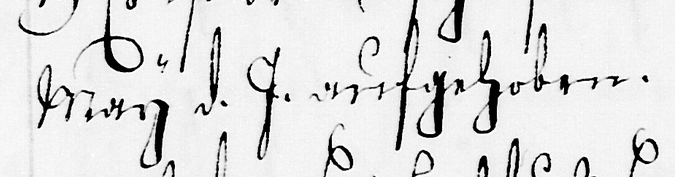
May d. J. aufgehoben.
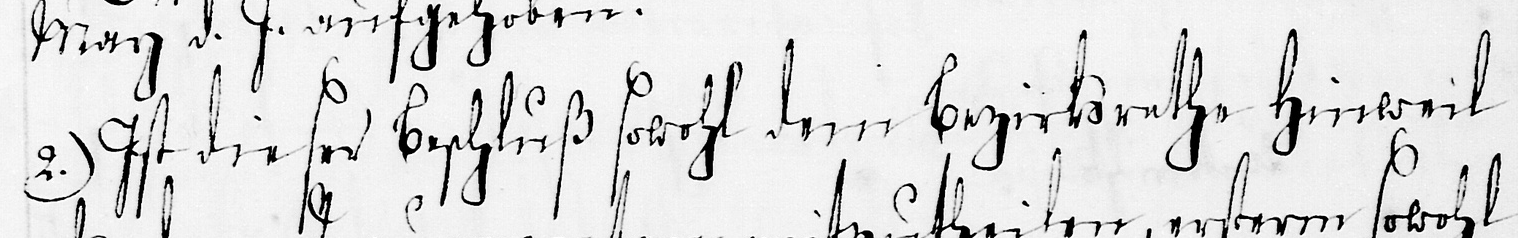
2.) Ist dieser Beschluß sowohl dem Bezirksrathe Hinweil
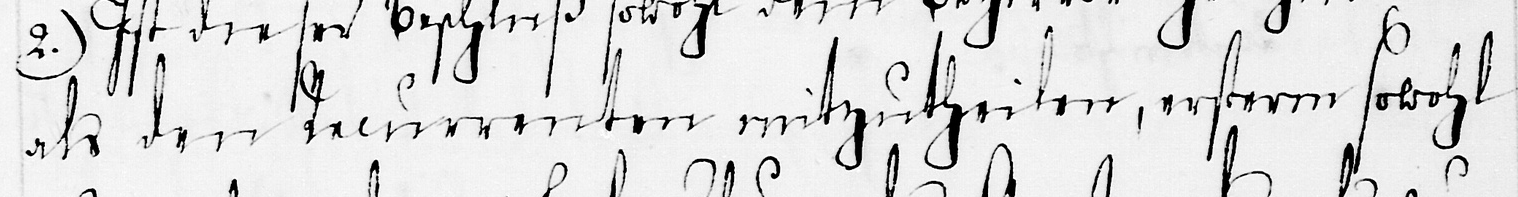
als den Recurrenten mitzutheilen, ersterm sowohl
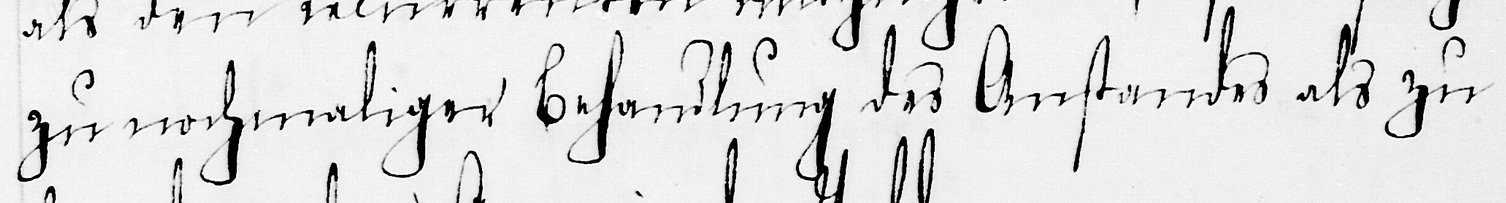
zu nochmaliger Behandlung des Anstandes als zu
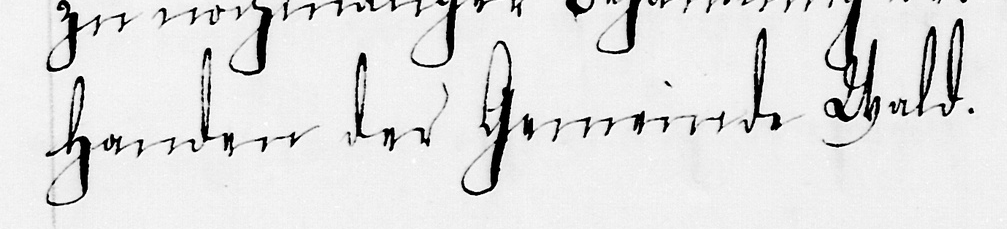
Handen der Gemeinde Wald.
